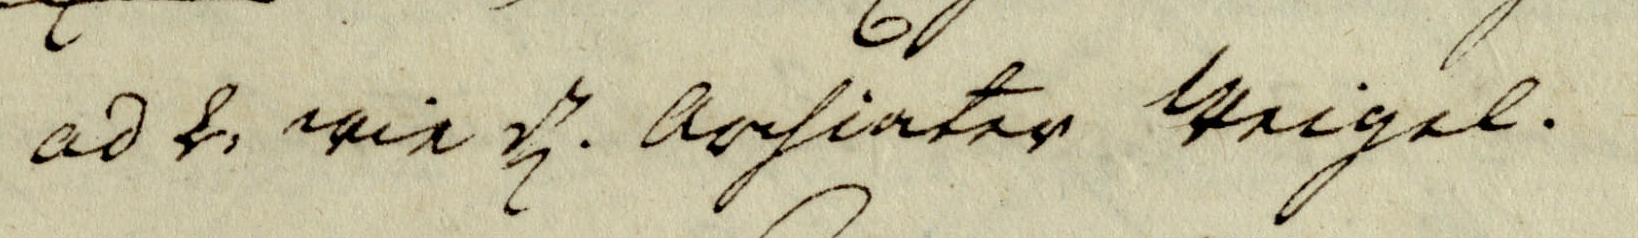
ad 2., wie dh. Archiater Weigel.
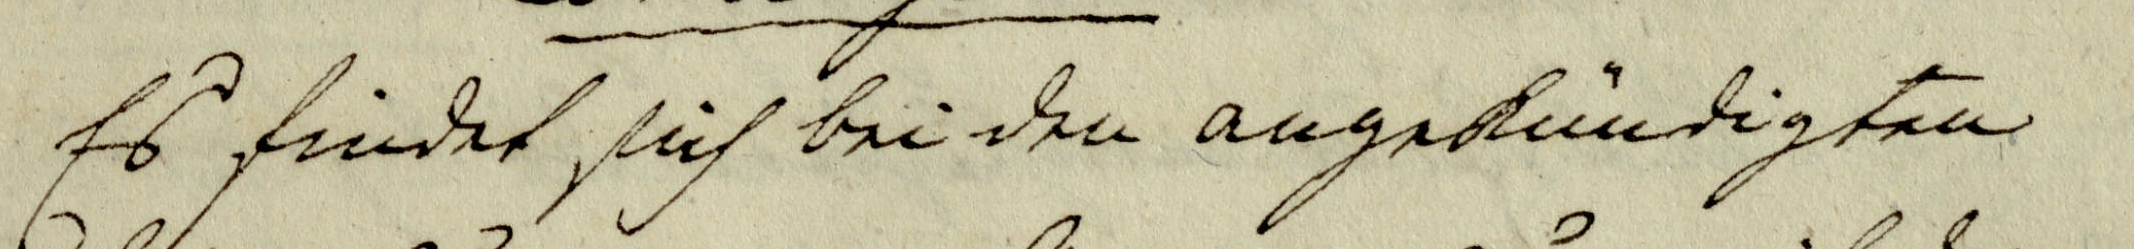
Es findet sich bei den angekündigten
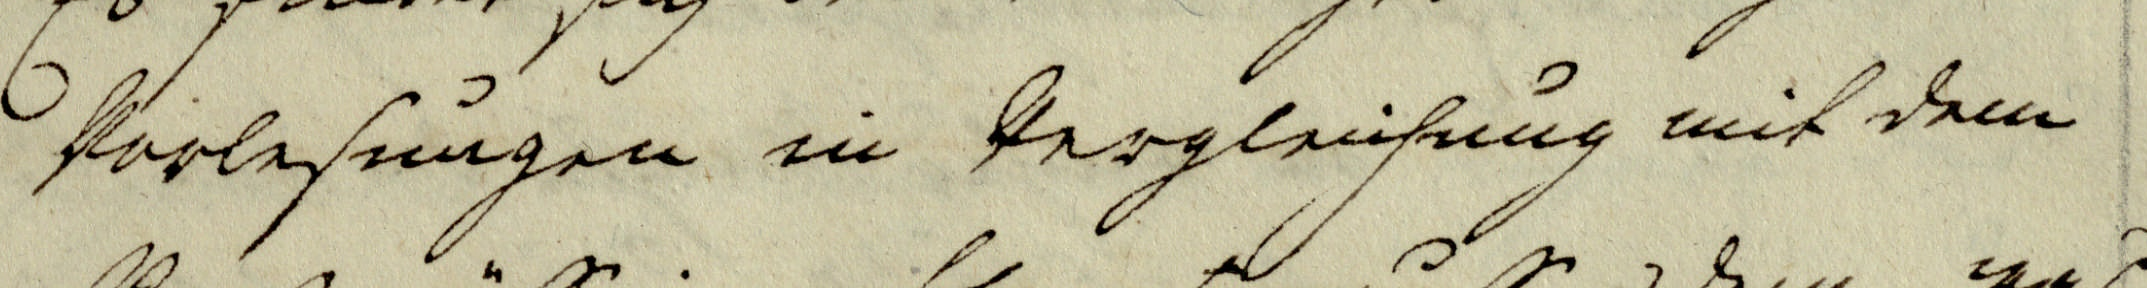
Vorlesungen in Vergleichung mit dem
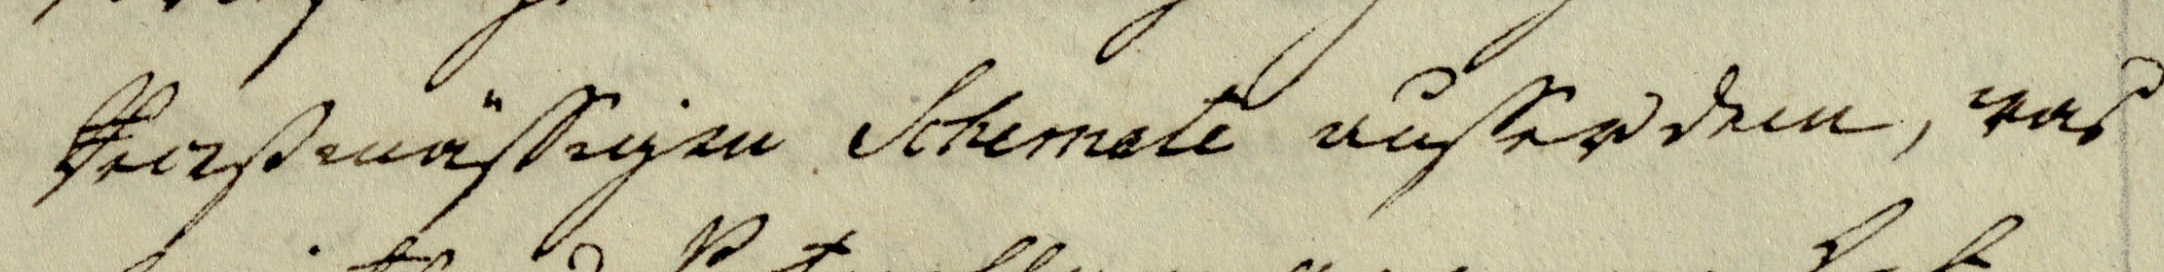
Receßmässeigen Schemate ausser dem, was
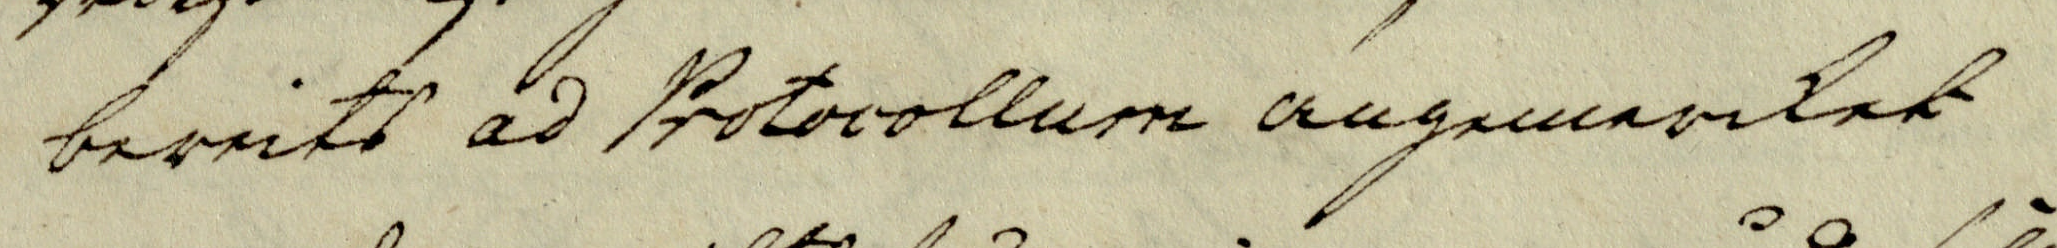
bereits ad Protocollum angemercket
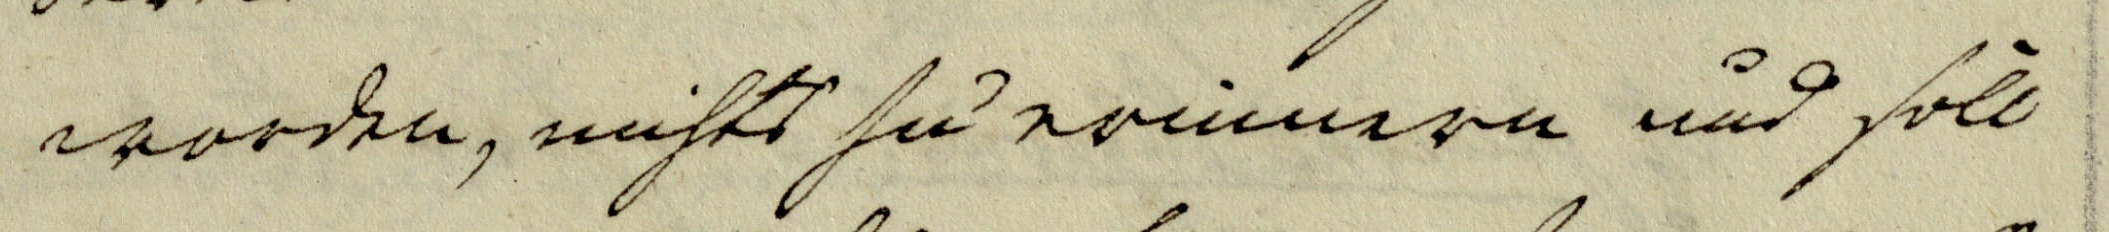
worden, nichts zu erinnern und soll
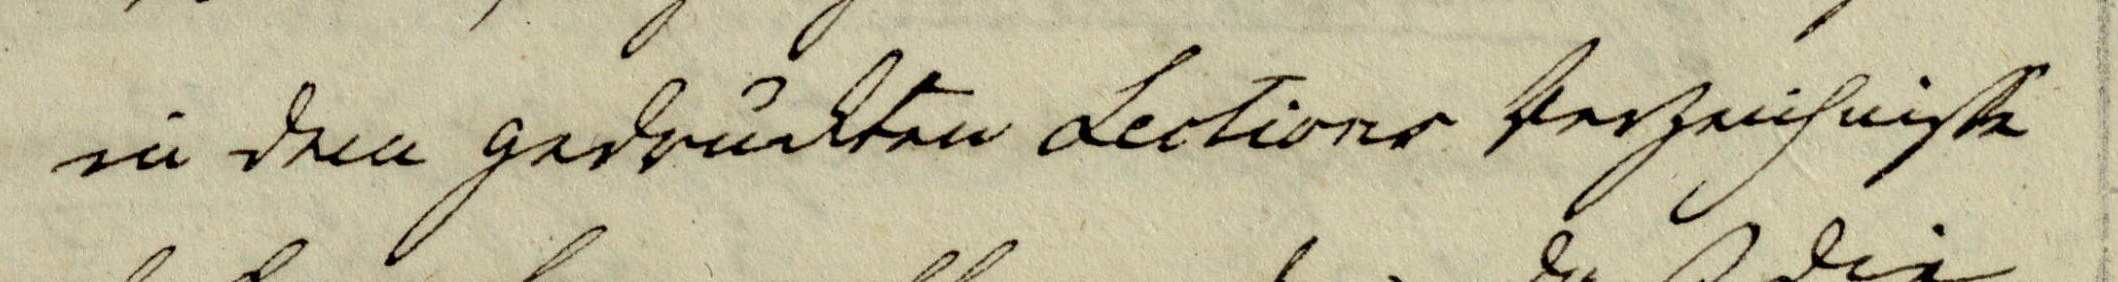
in dem gedruckten Lections Verzeichnisse
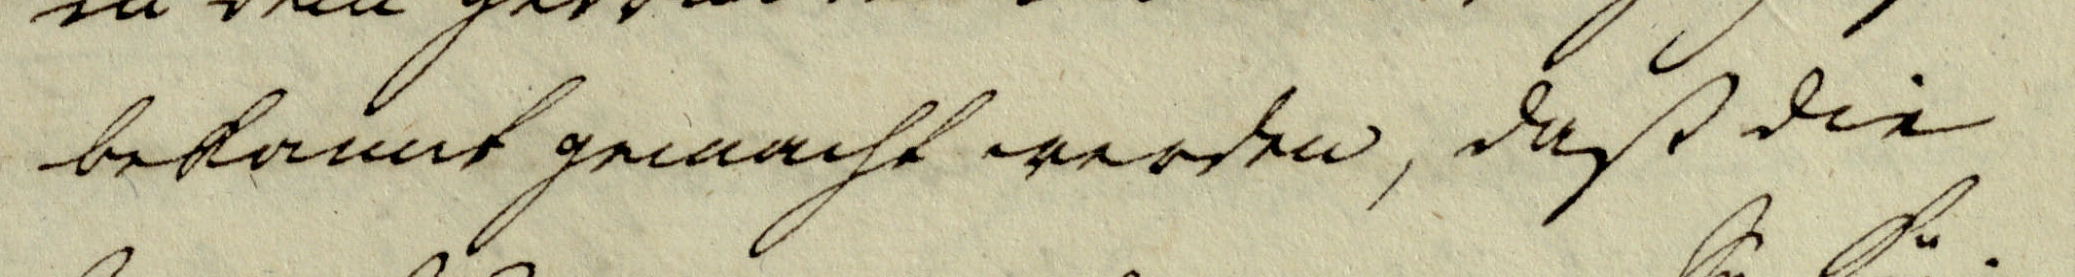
bekannt gemacht werden, daß die
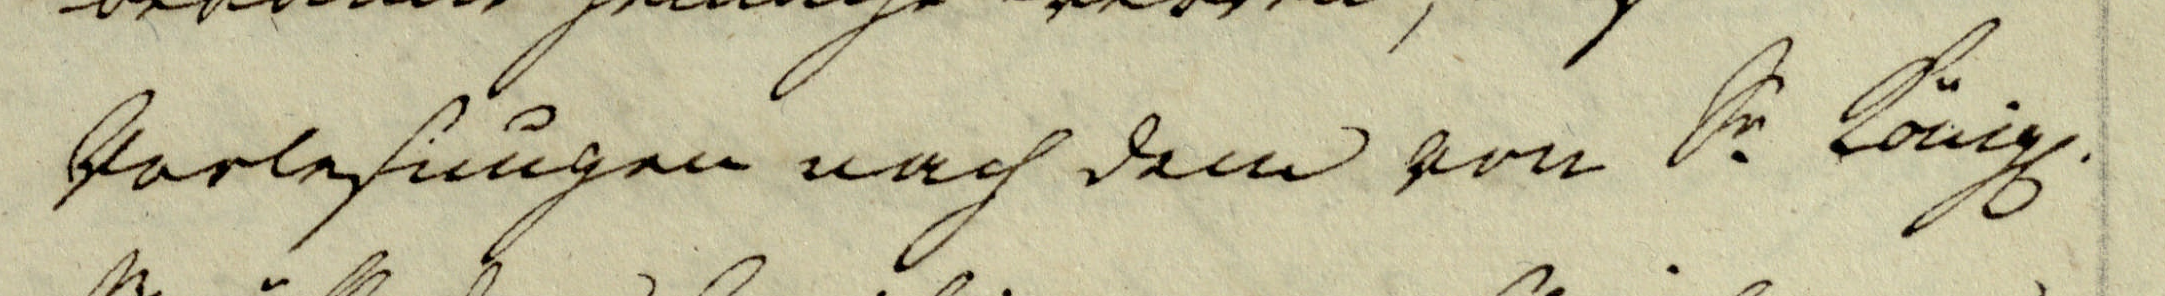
Vorlesungen nach dem von Sr Königl.
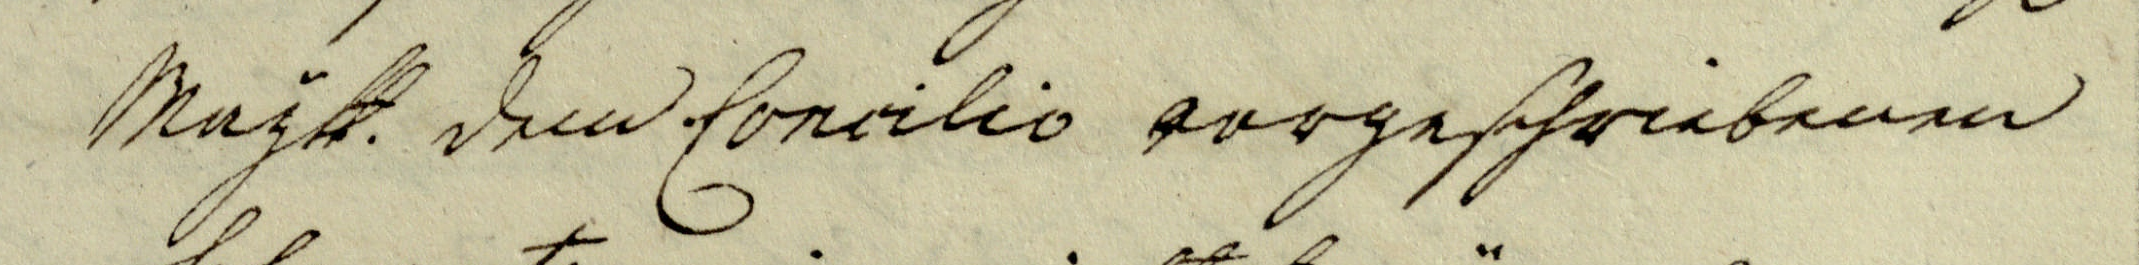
Maÿtt. dem Concilio vorgeschriebenen
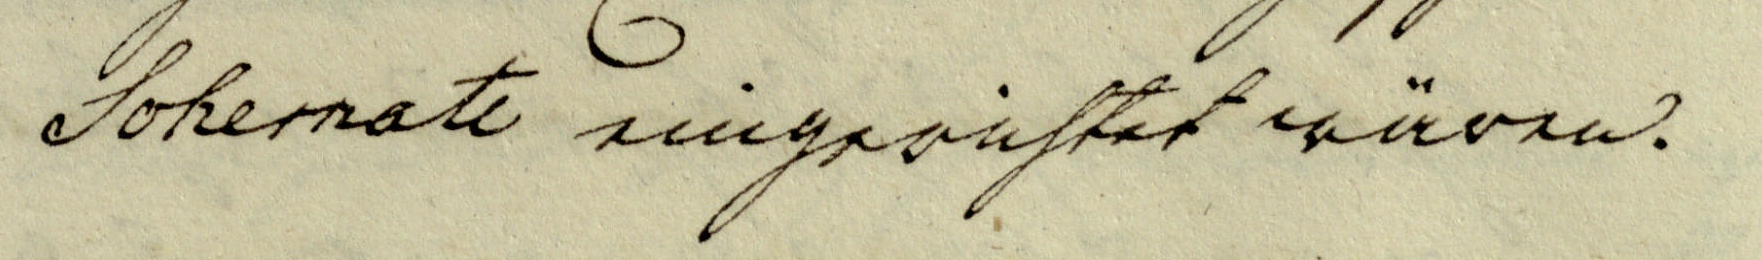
Schemate eingerichtet wären.
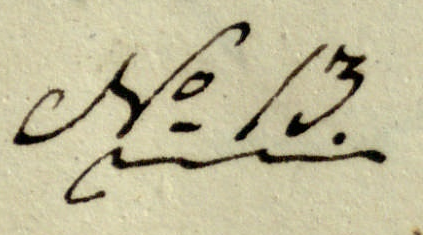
No 13.
